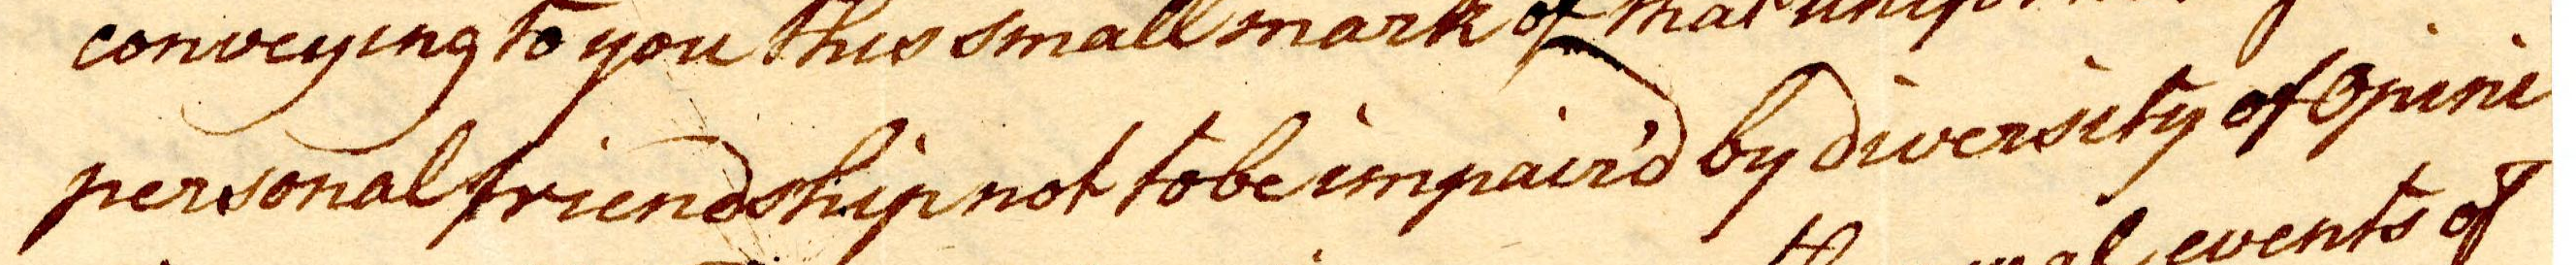personal friendship not to be impair'd by diversity of Opini
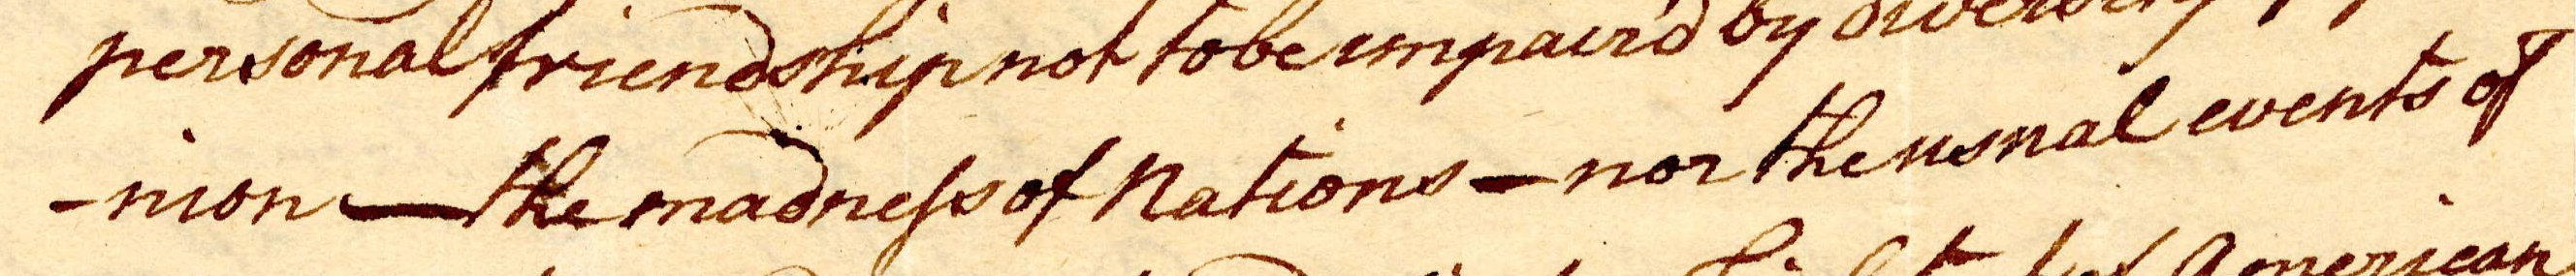-nion- The madness of Nations- nor the usual events of
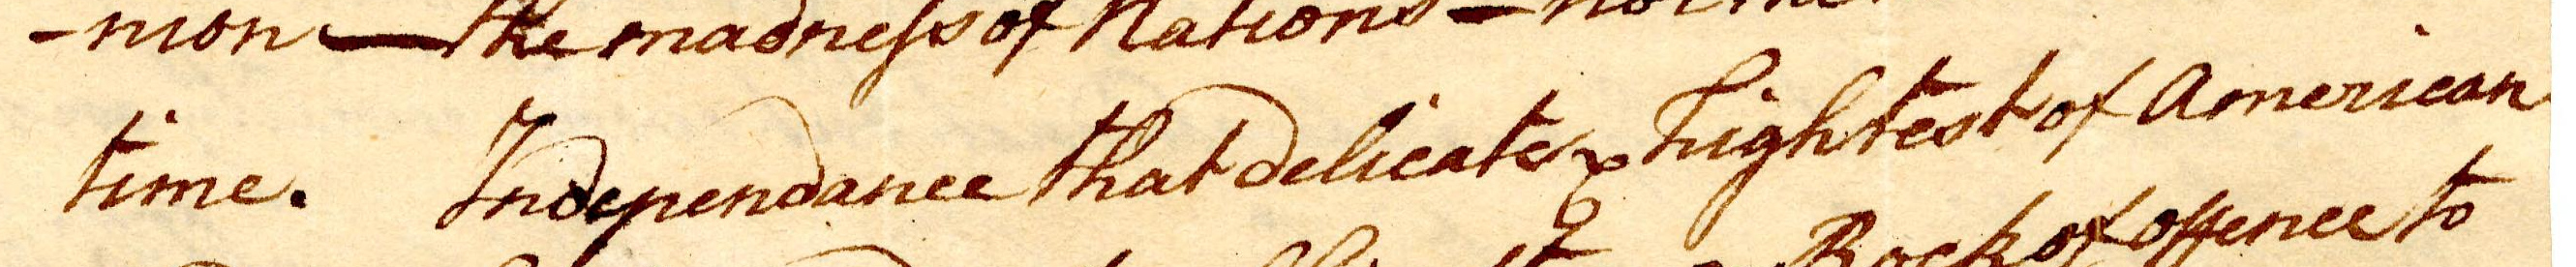time. Independance that delicate, hightest of American
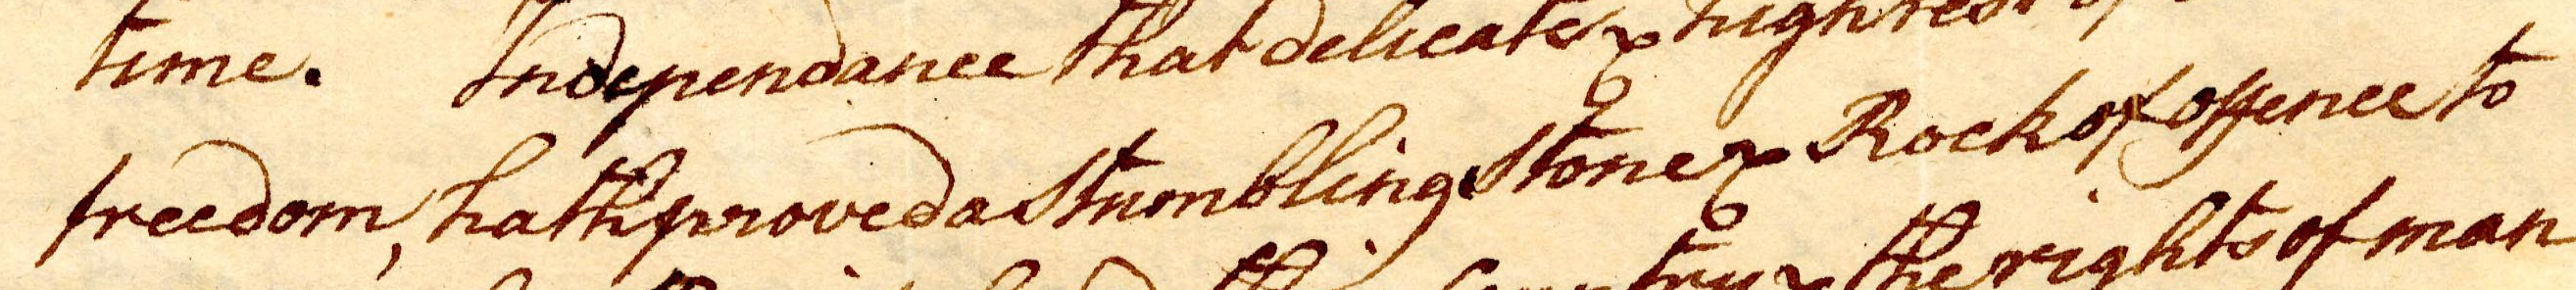freedom, hath proved a Stumbling Stone & Rock of offence to
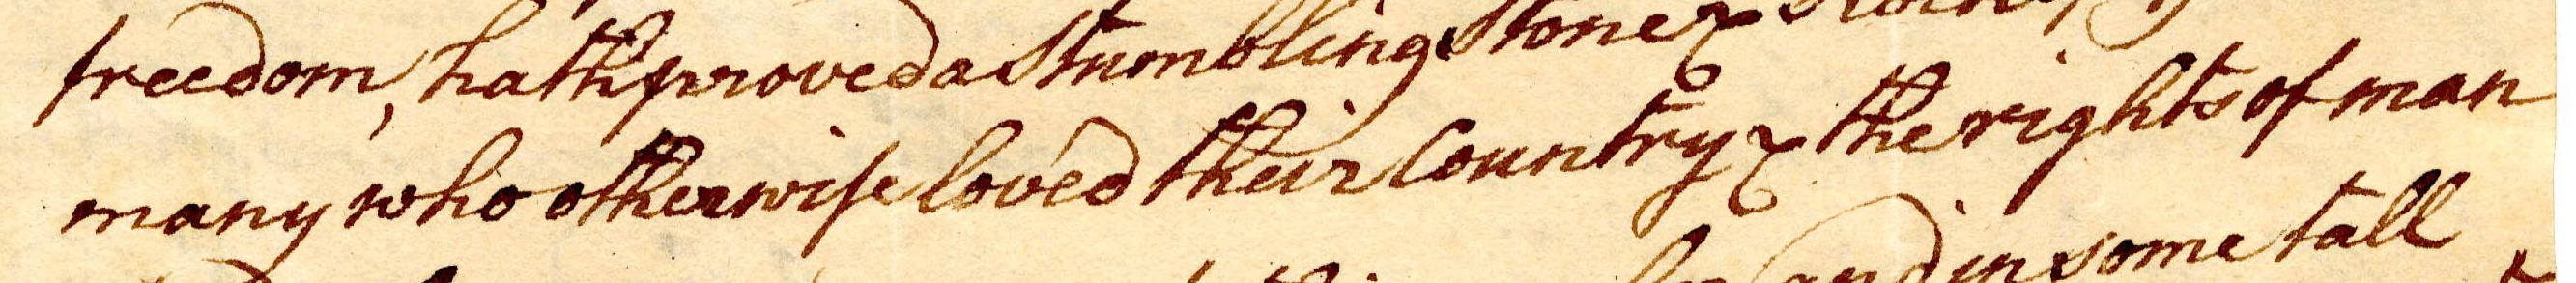many who otherwise loved their Country & the rights of man
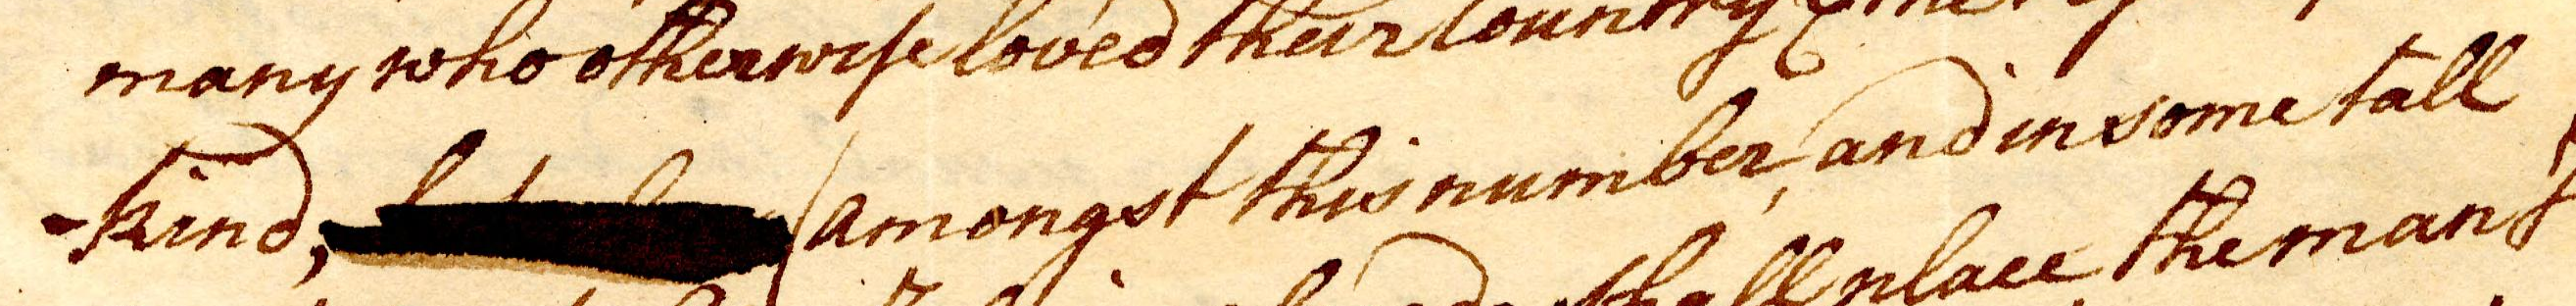kind- [________] (Amongst this number, and in some tall
